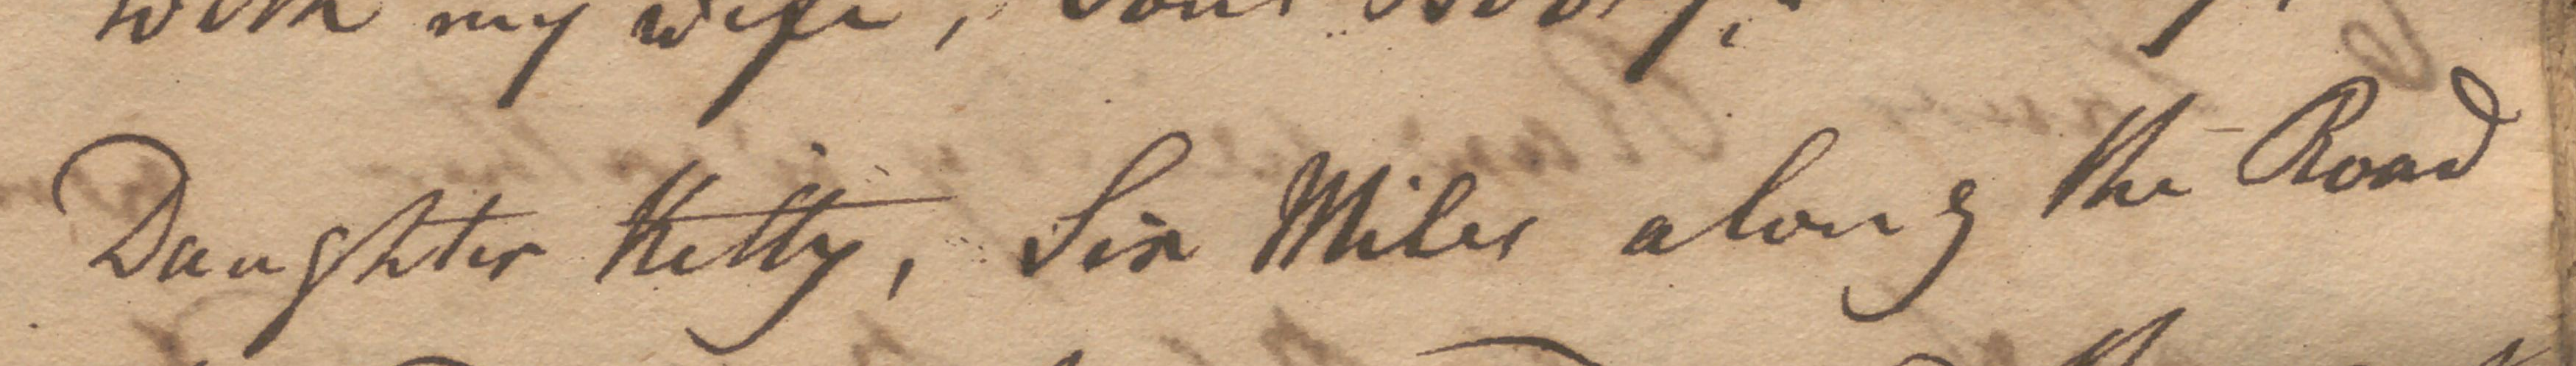Daughter Kitty, Six Miles along the Road
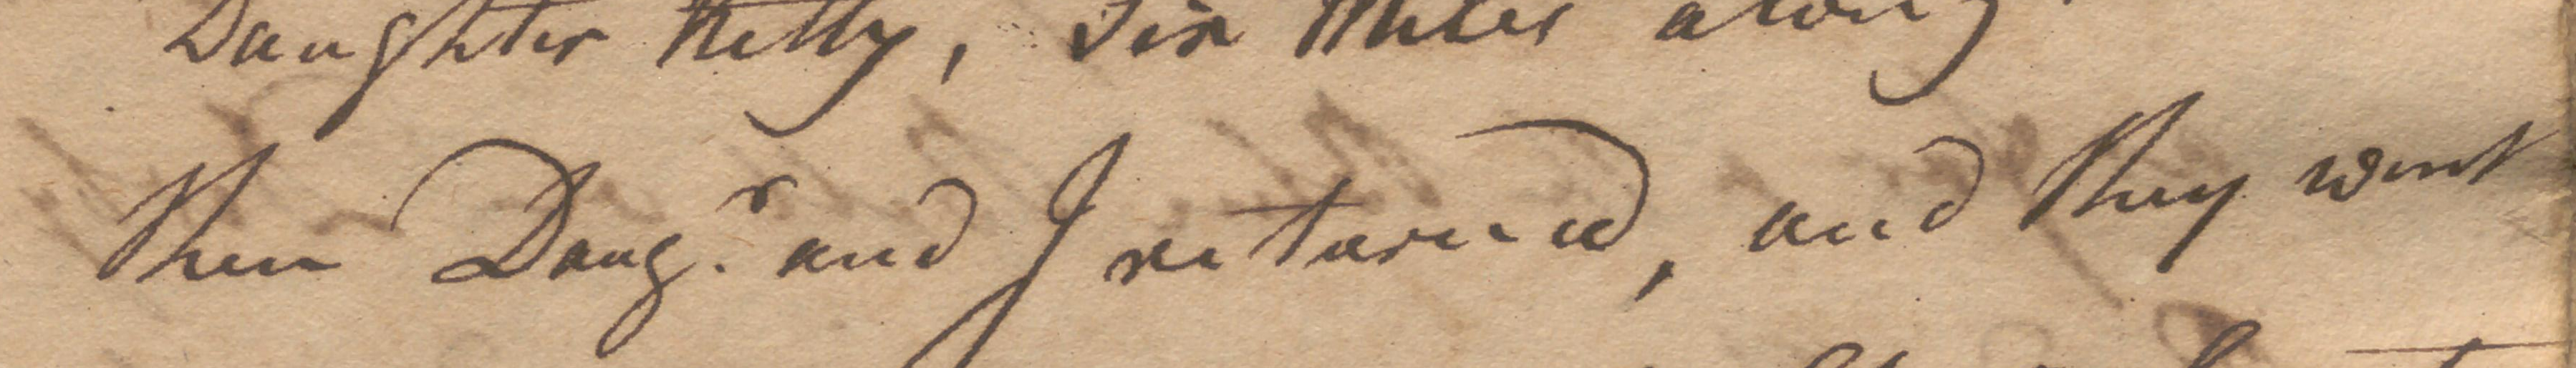their Daug^r. and I returned, and they went
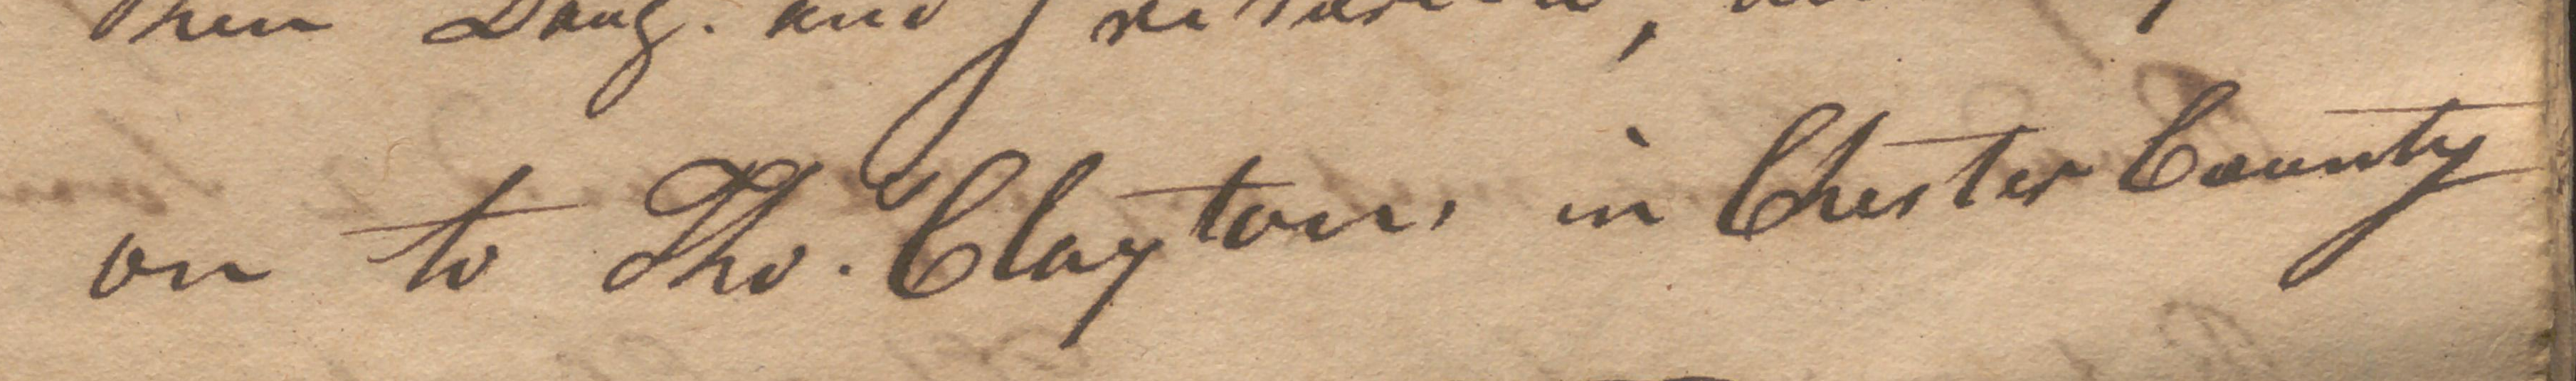on to Tho^s. Claytons in Chester County
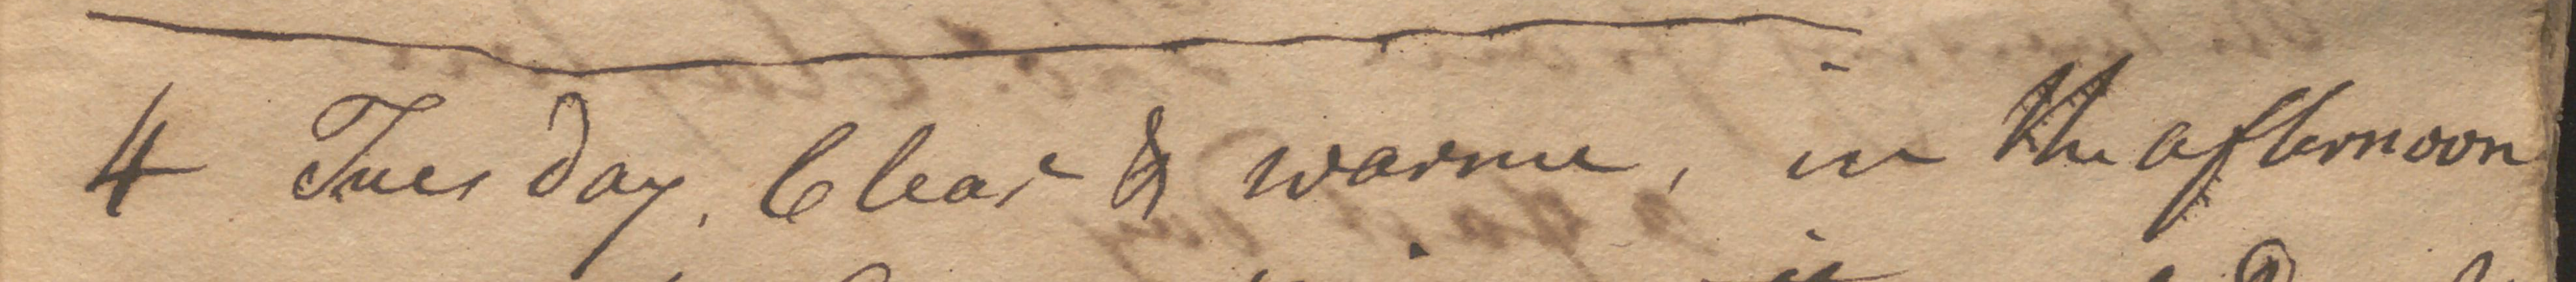4 Tuesday, Clear & warme, in the afternoon
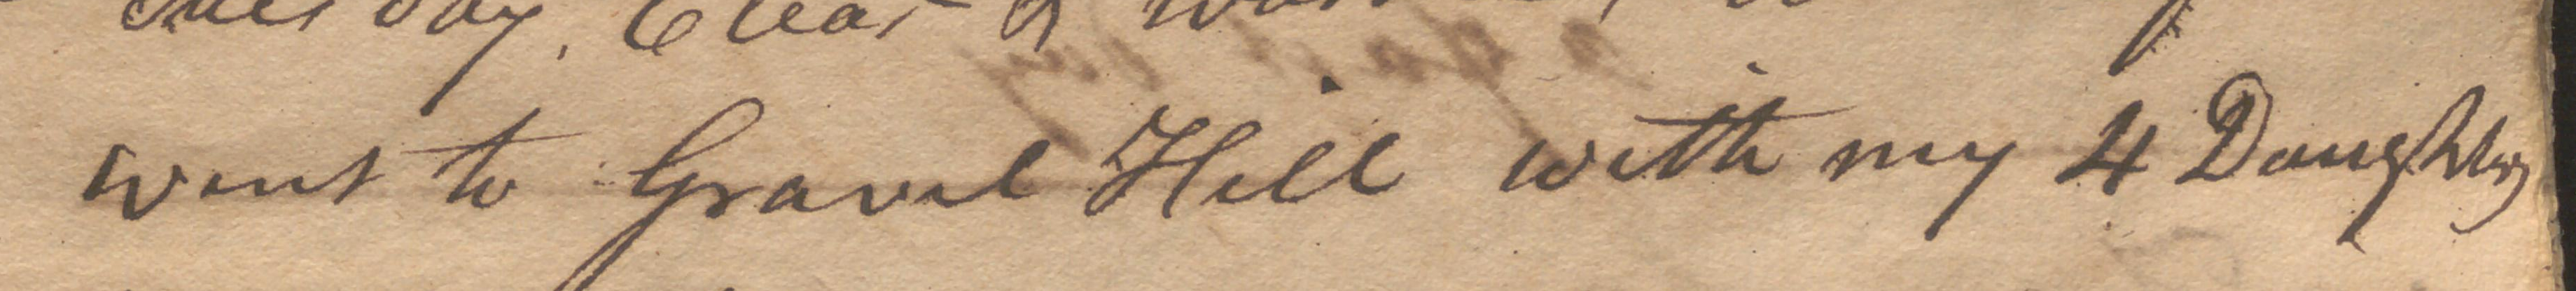went to Gravel Hill with my 4 Daughts
